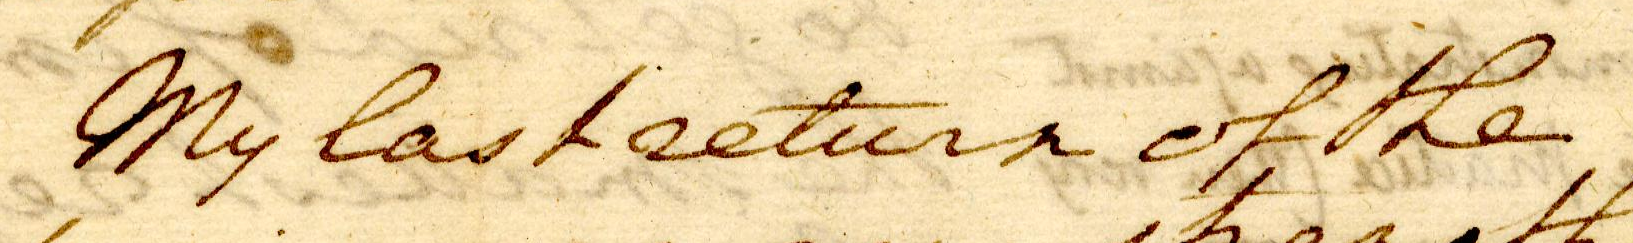My last return of the
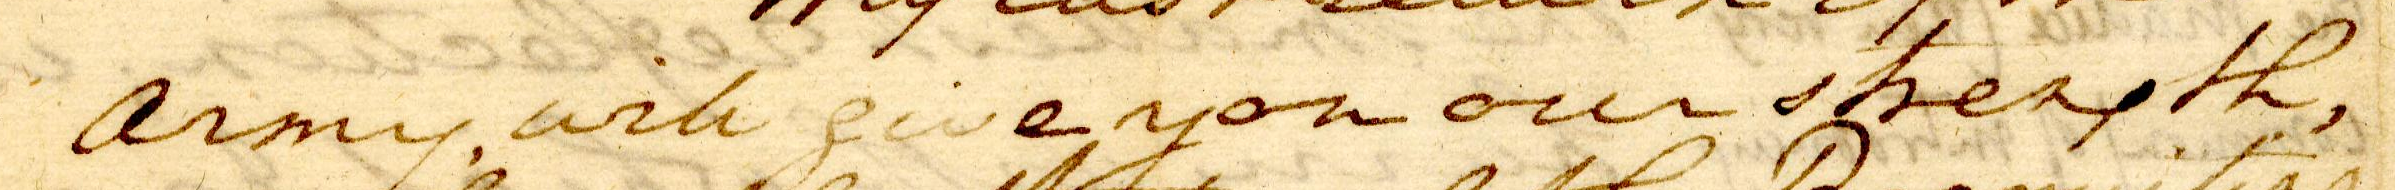army, will give you our strength,
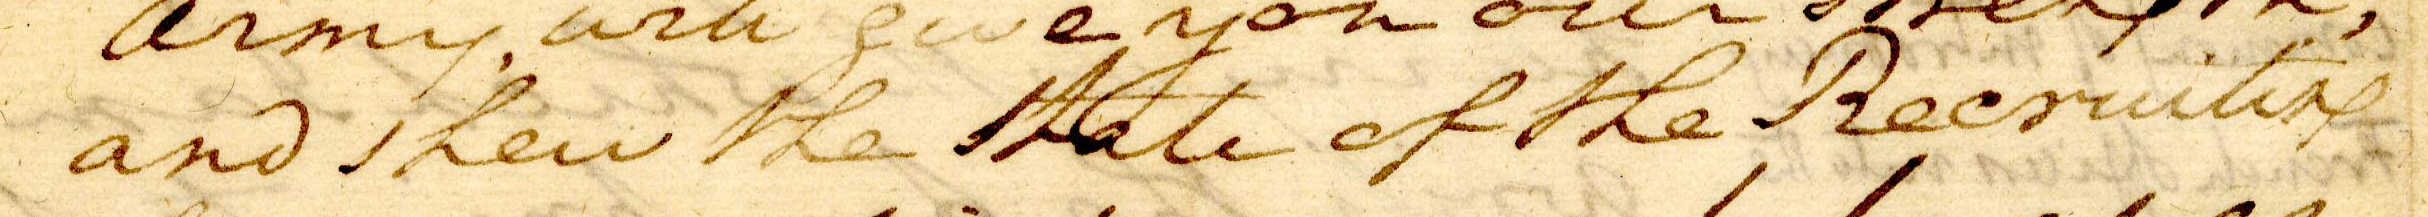and show the state of the Recruiting
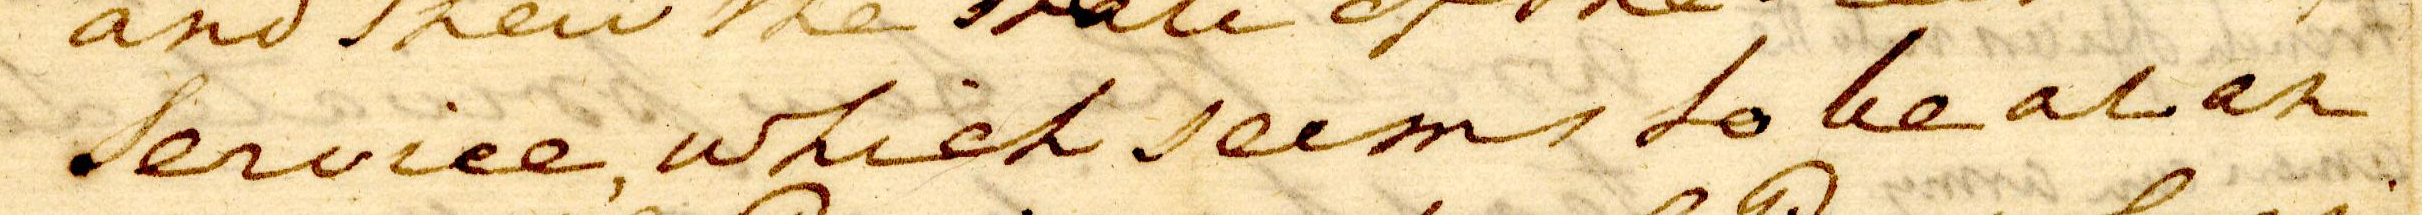Service, which seems to be at an
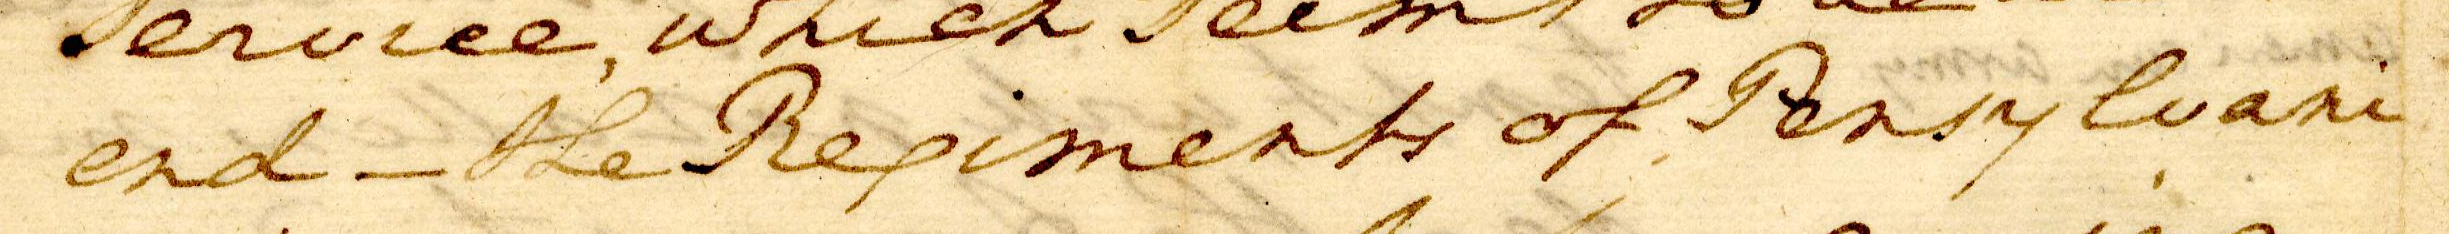end- the Regiments of Pennsylvani
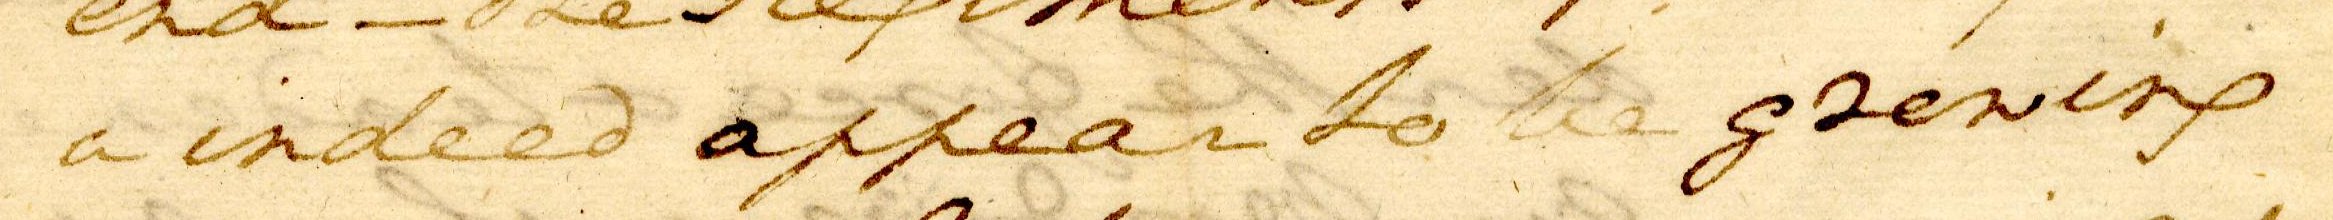a indeed appear to be growing
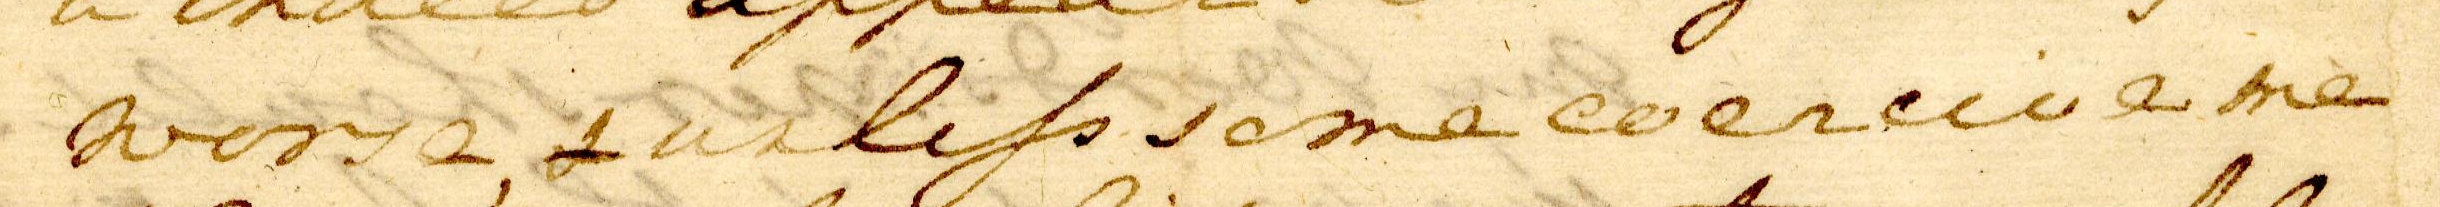worse, unless some coercive me
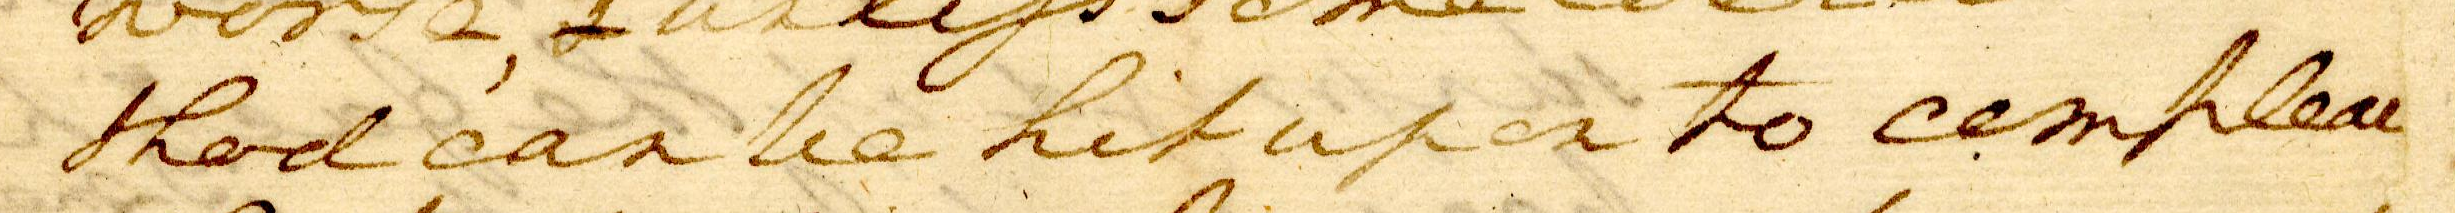thod can be hit upon to compleat
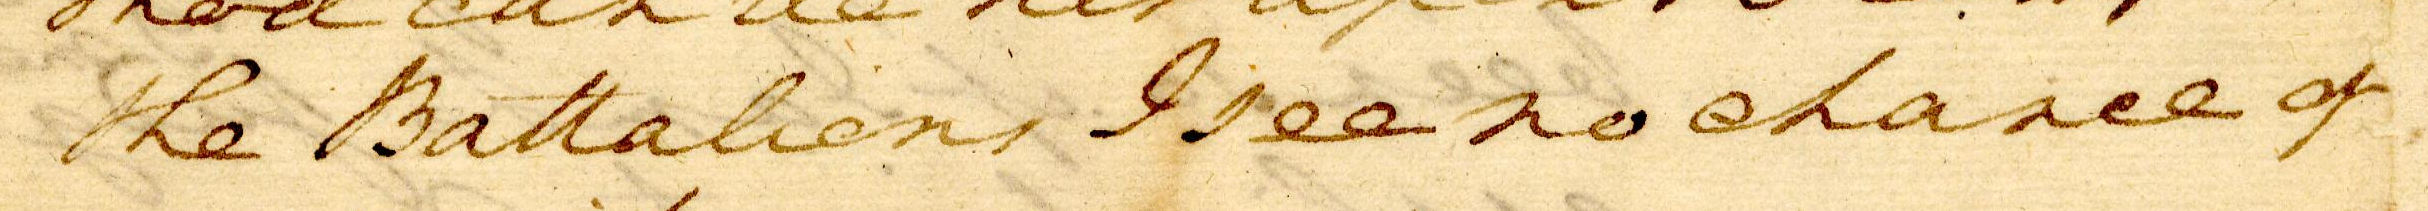the Battalions I see no chance of
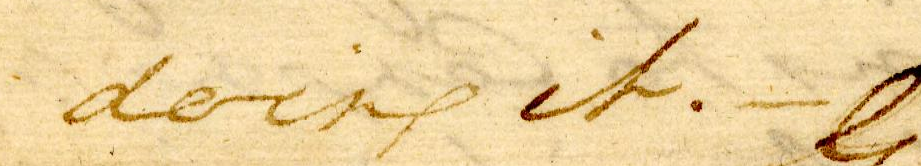doing it.-
